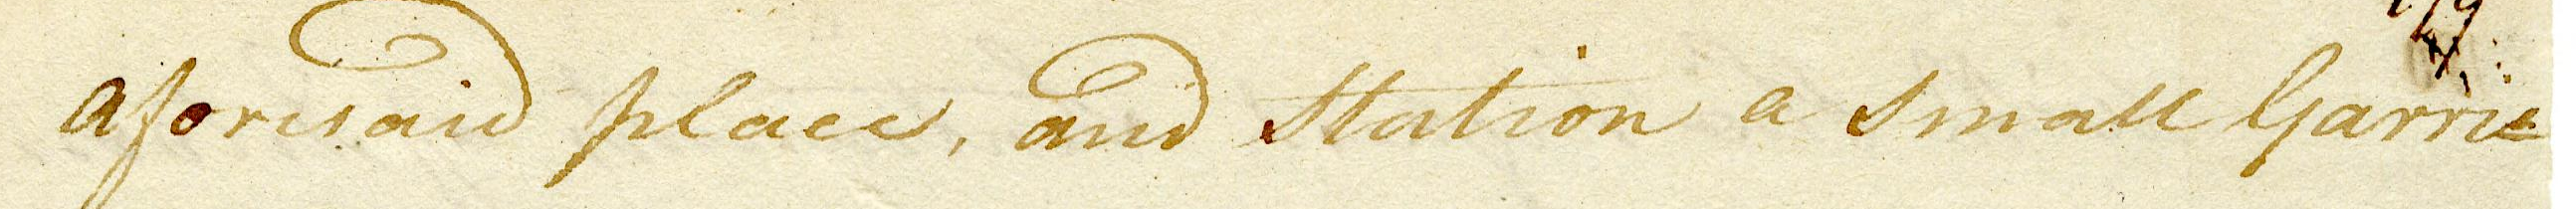aforesaid place, and Station a small Garri-
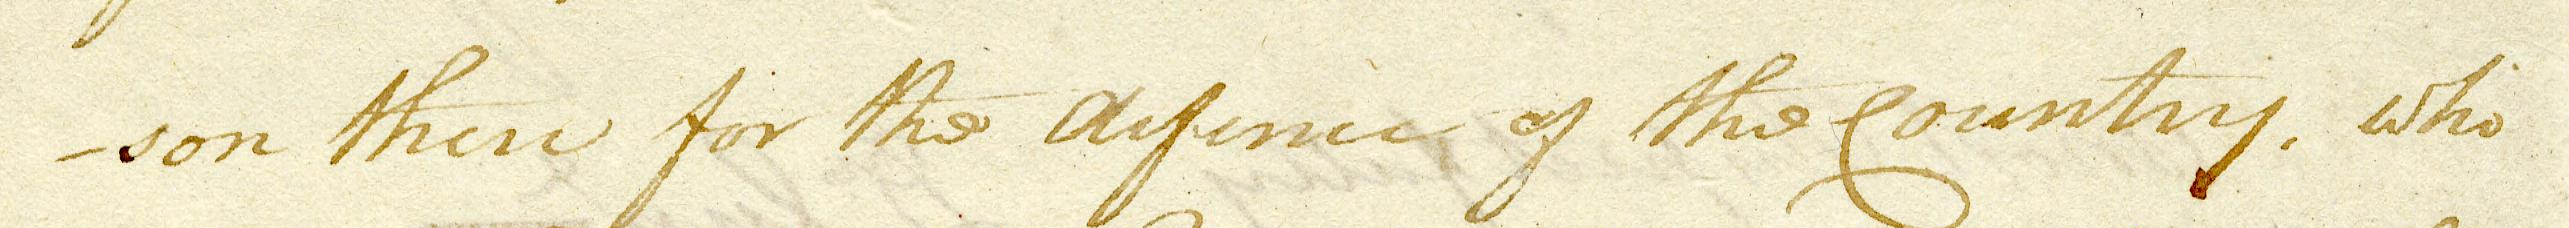-son there for the defence of this Country, who
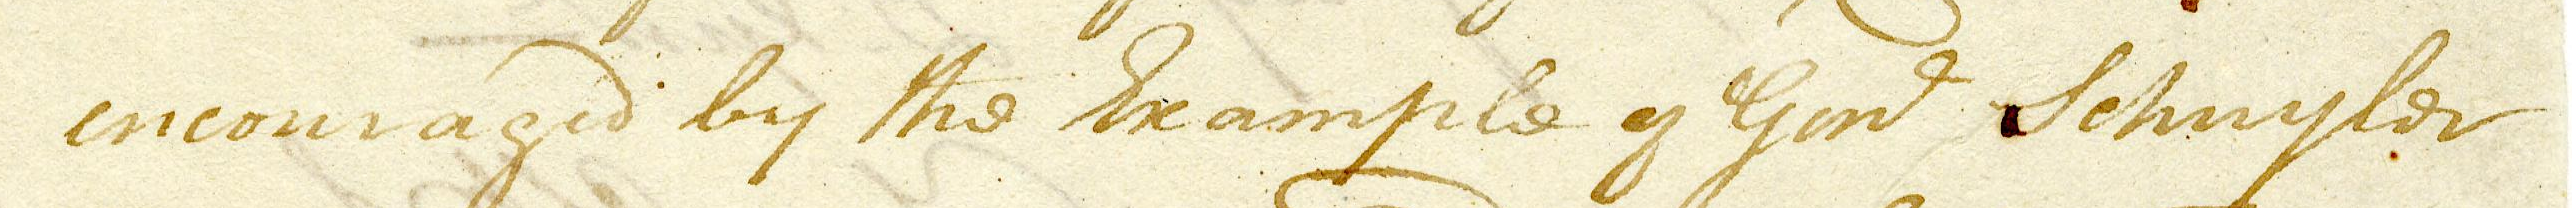encouraged by the Example of Gen^l Schuyler
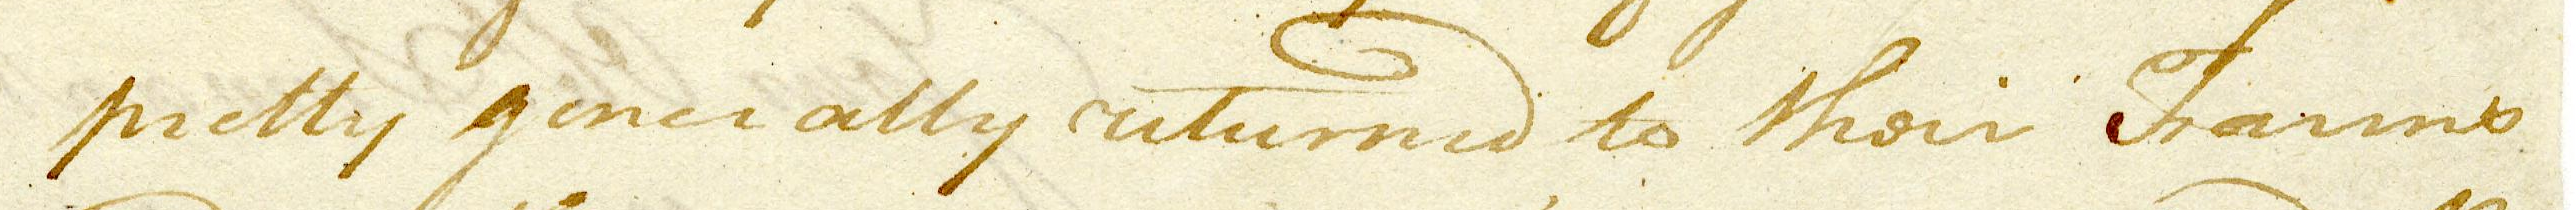pretty generally returned to their Farms
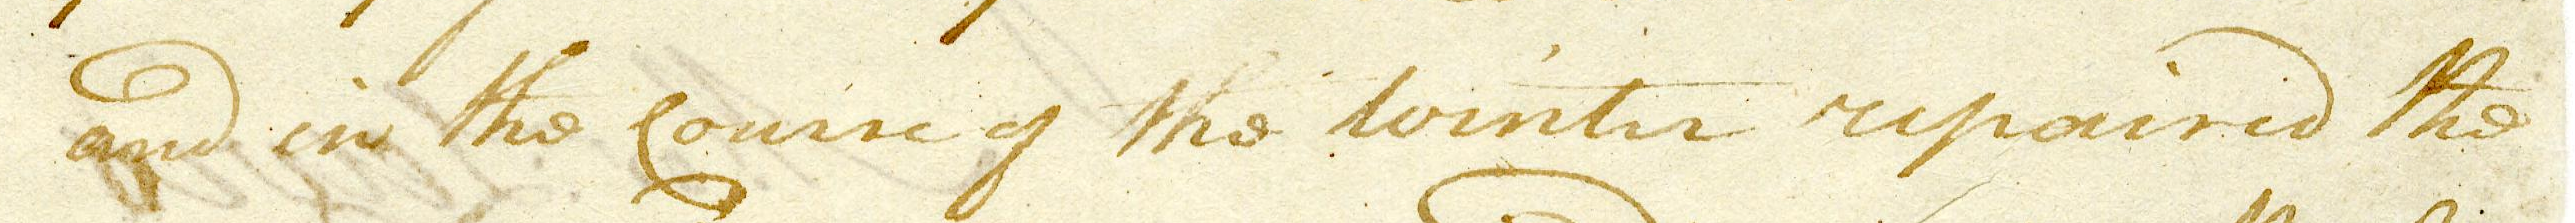and in the Course of the winter repaired the
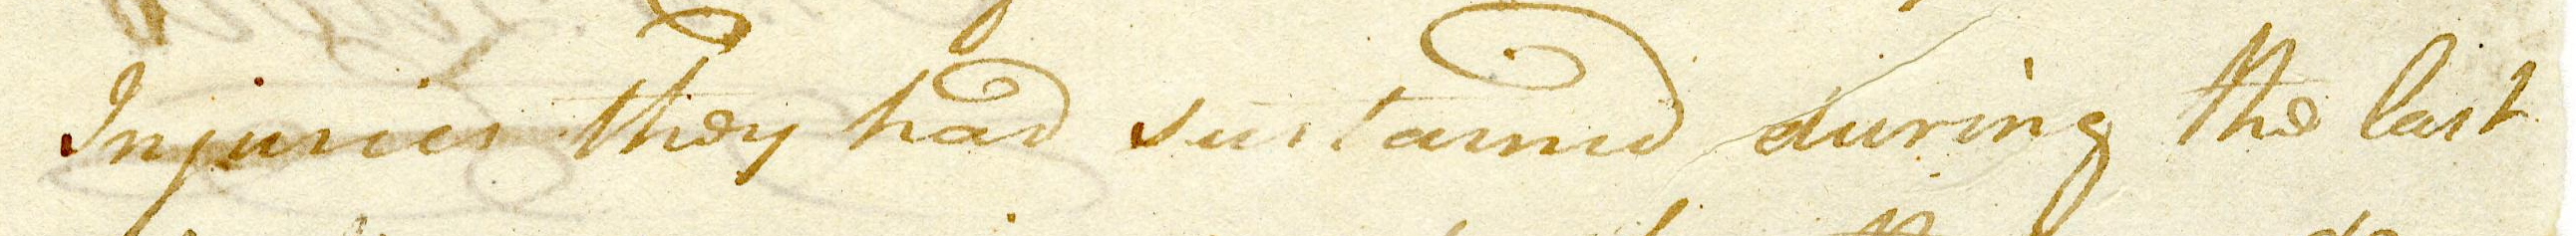Injuries they had sustained during the last
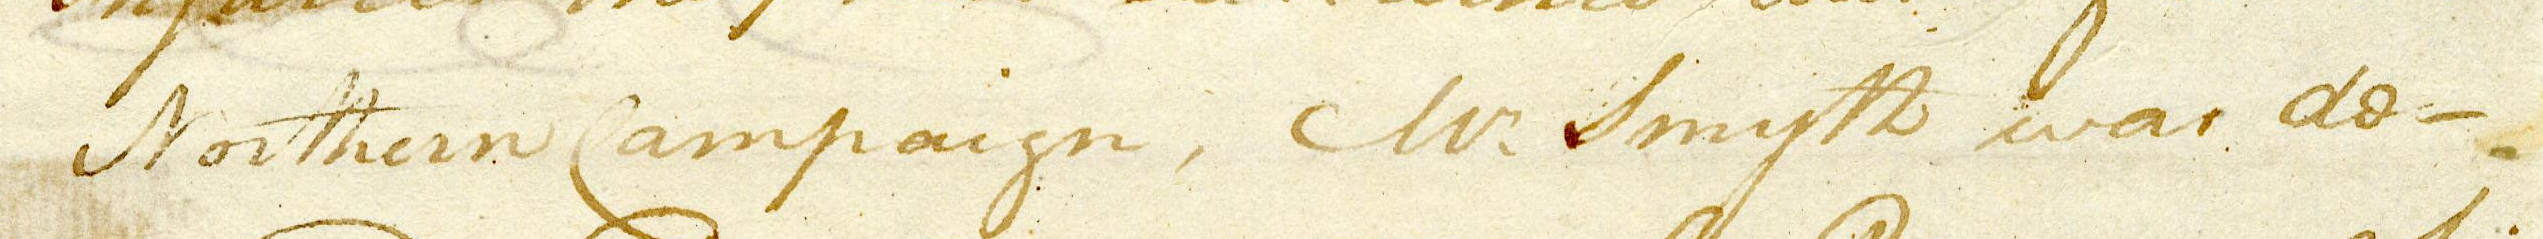Northern Campagin, M^r. Smyth was de-
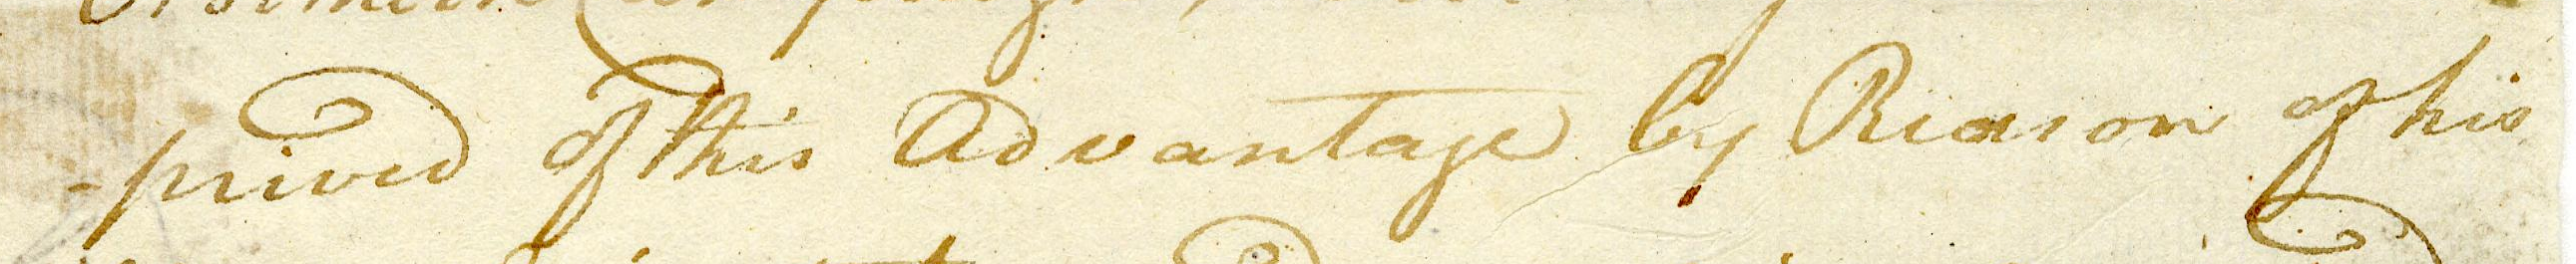prived of this Advantage by Reason of his
